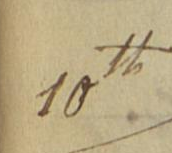10^th
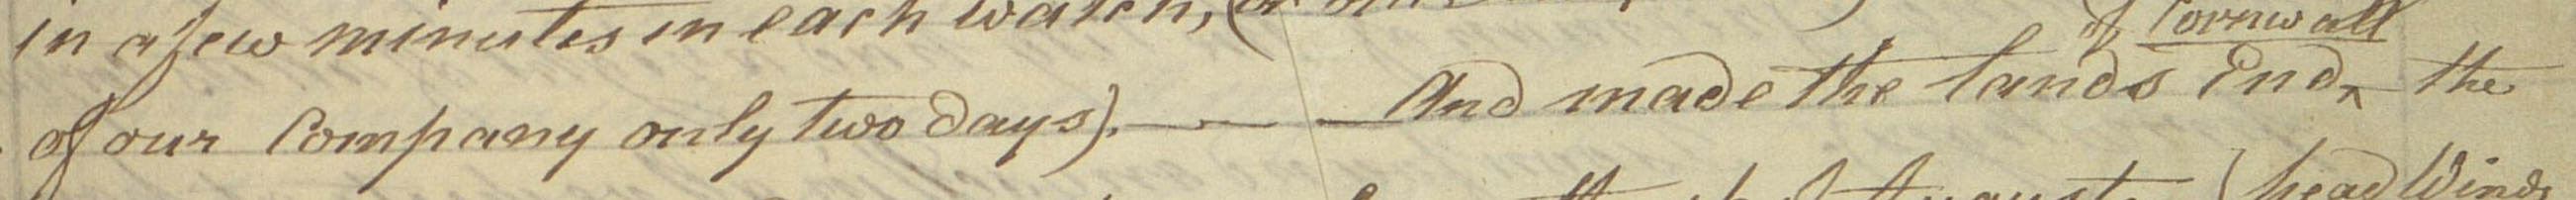of our Company only two days) And made the lands End ^ the
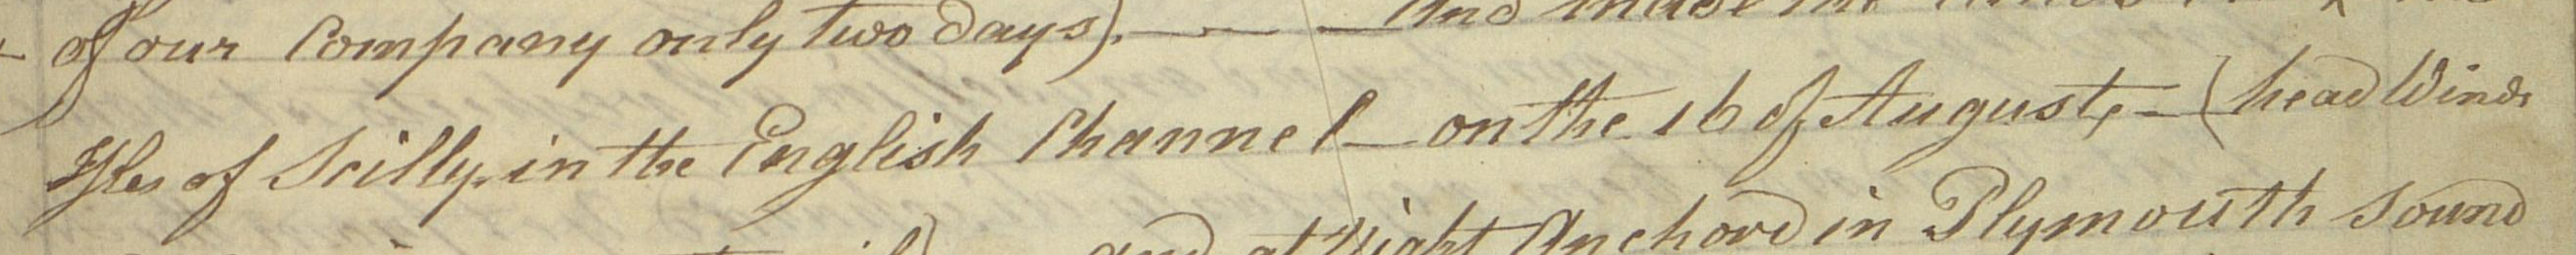Isles of Scilly in the English Channel on the 16 of August, (head Winds
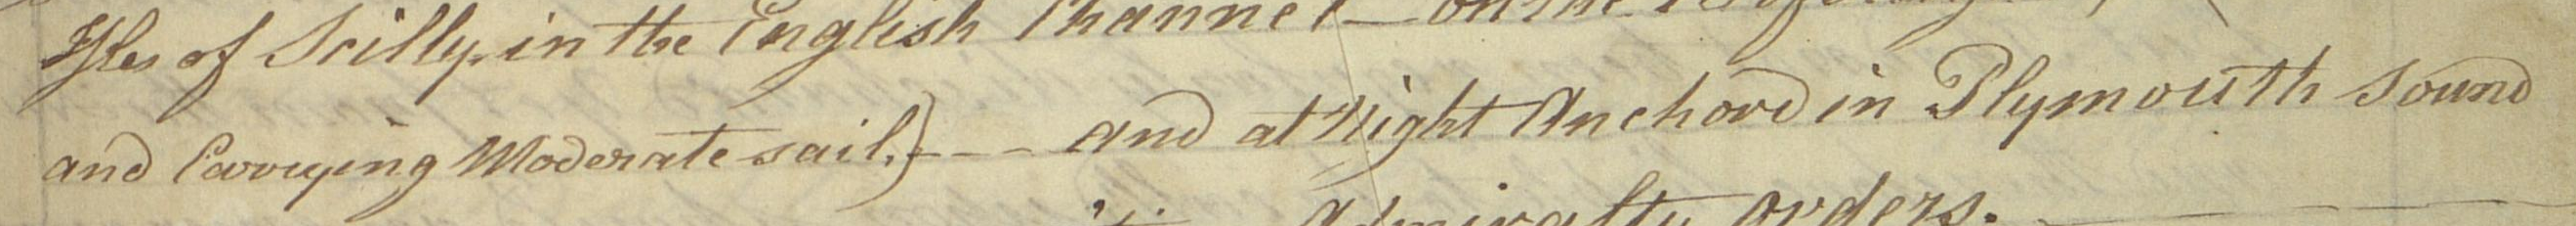and Conveying Moderate sail.) And at night Anchord in Plymouth sound
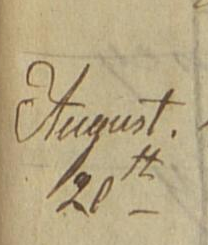August
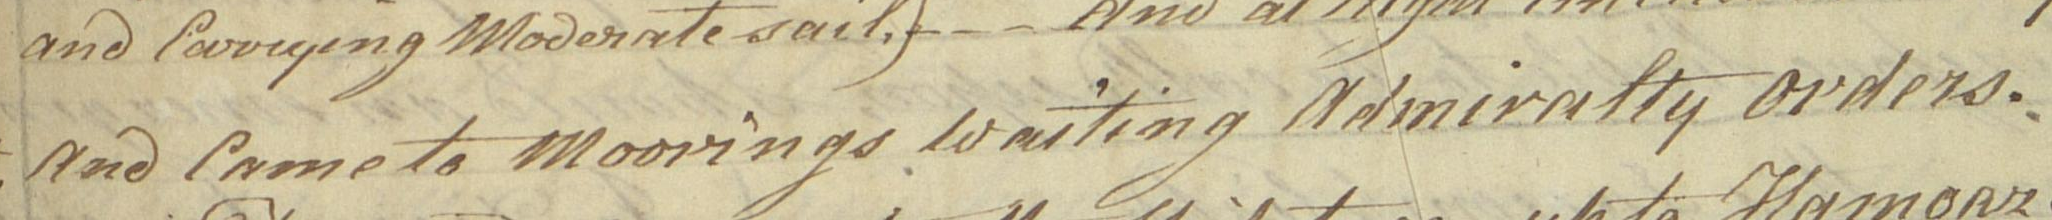and Came to Moorings waiting Admiralty orders.
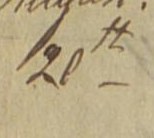20^th
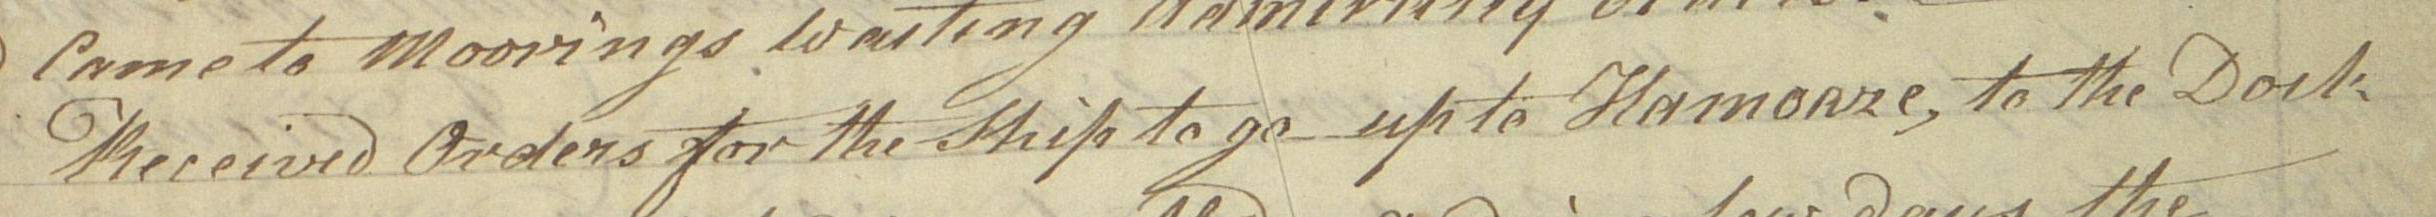Received Orders for the Ship to go up to Hamorre, to the Dock
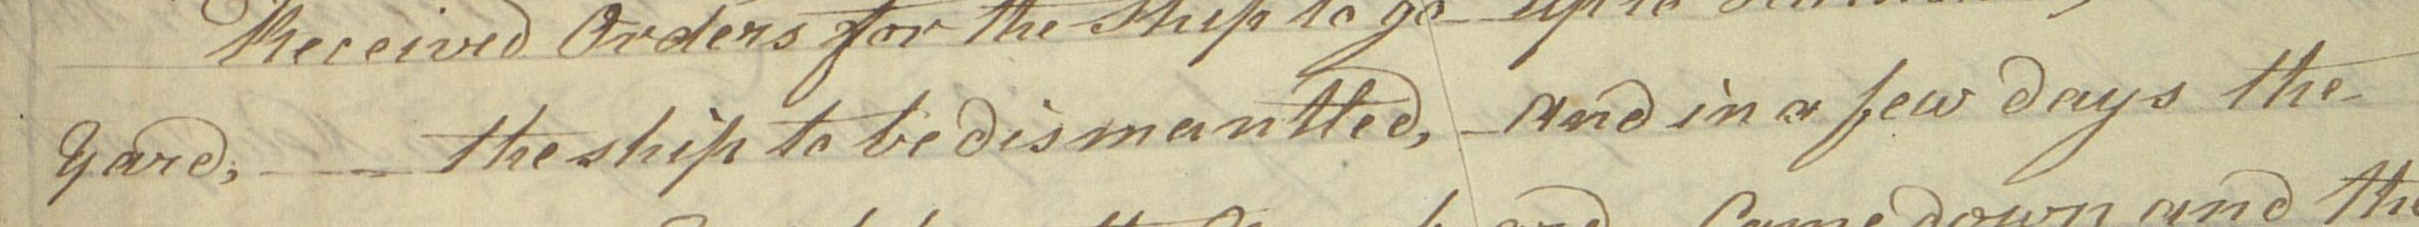Yard, the ship to be dismantled, and in a few days the
